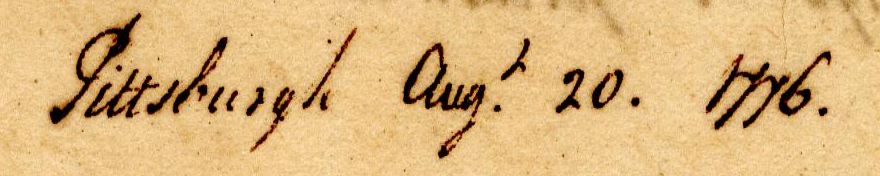Pittsburgh Aug^t. 20. 1776.
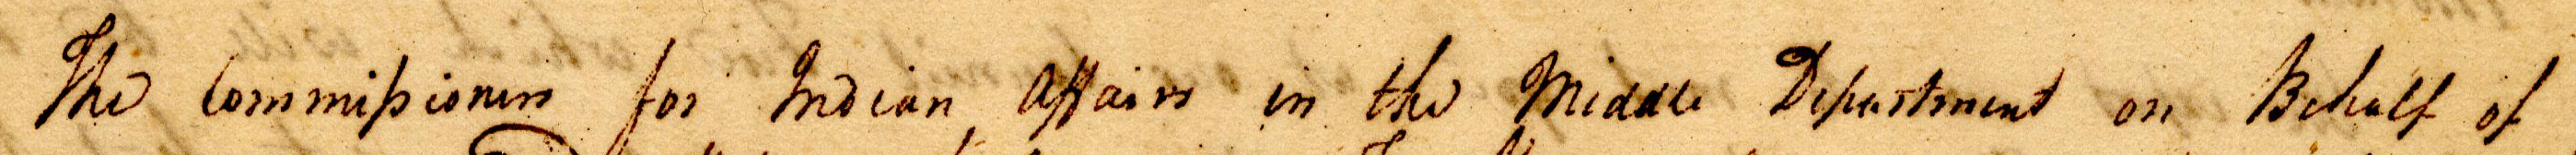The Commissioner for Indian Affairs in the Middle Department on Behalf of
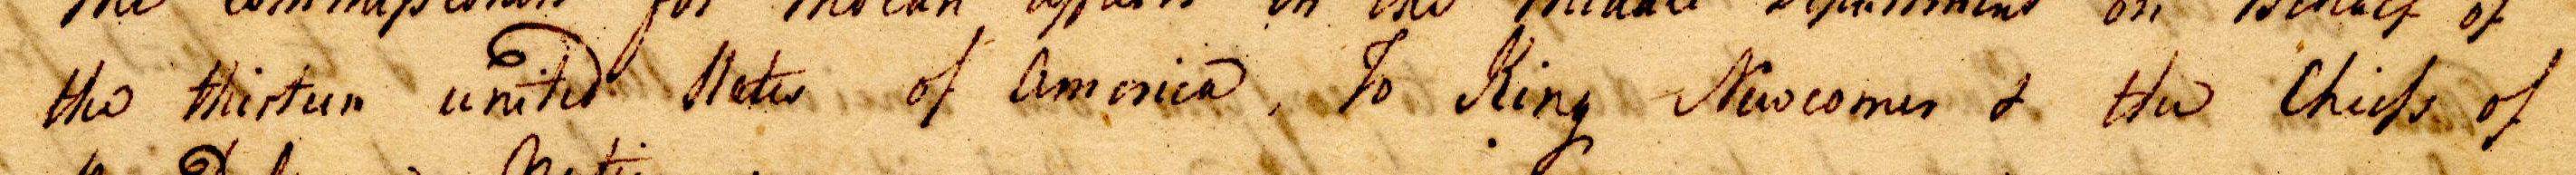the thirteen united States of America to King Newcomer & the Chiefs of
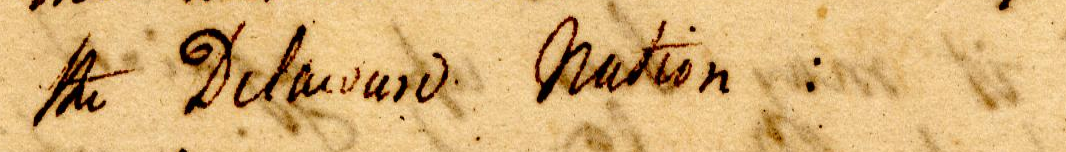the Delaware Nation:
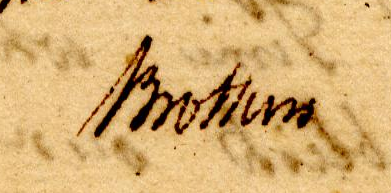Brothers
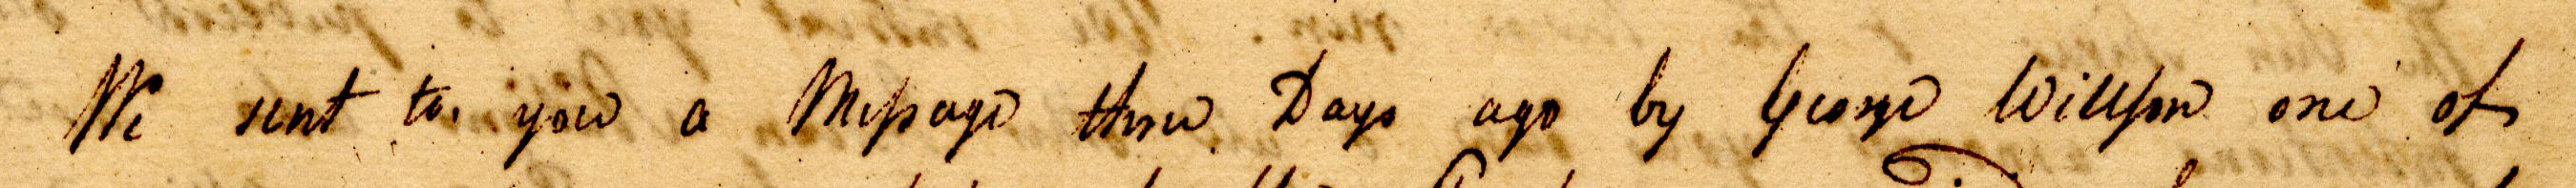We sent to you a Message three Days ago by George Willson one of
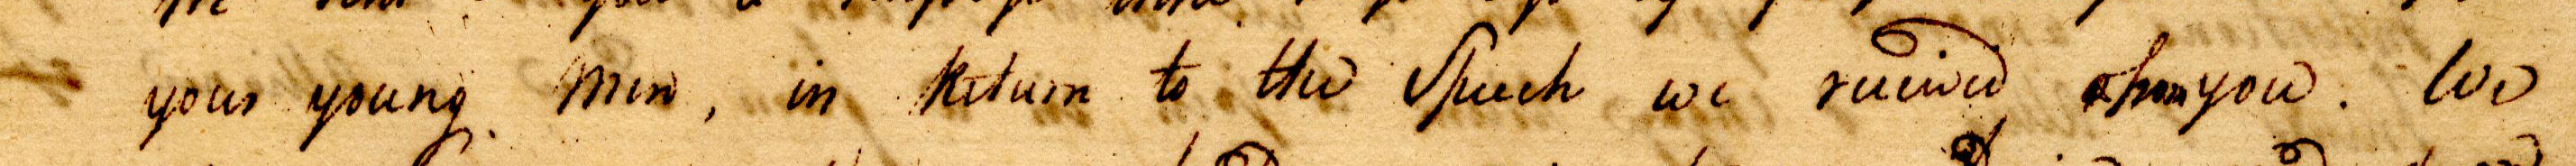your young Men, in Return to the Speech we received from you. We
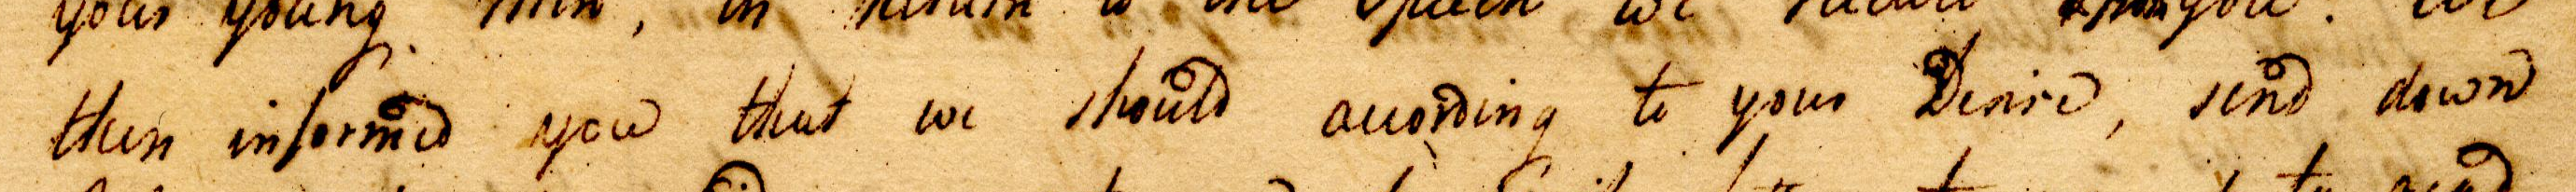then informed you that we should according to your Desire, send down
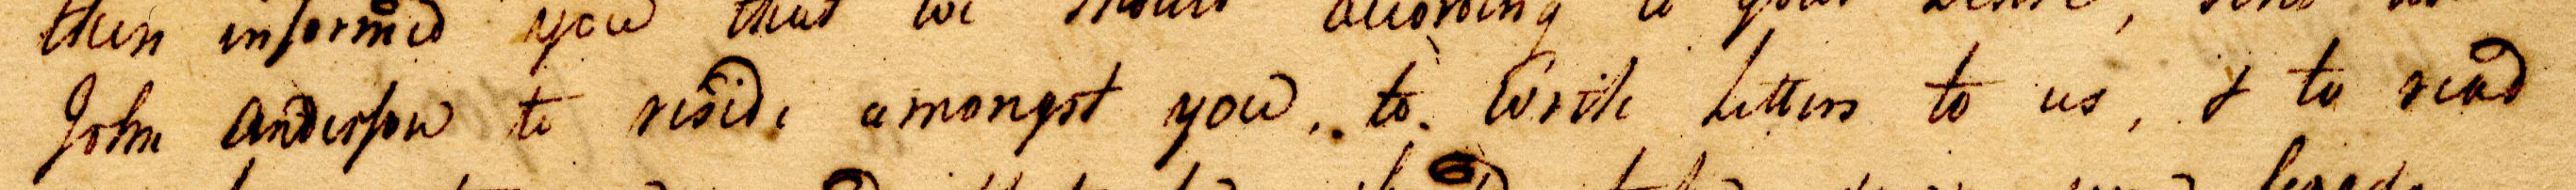John Anderson to reside amongst you, to Write Letters to us, & to read
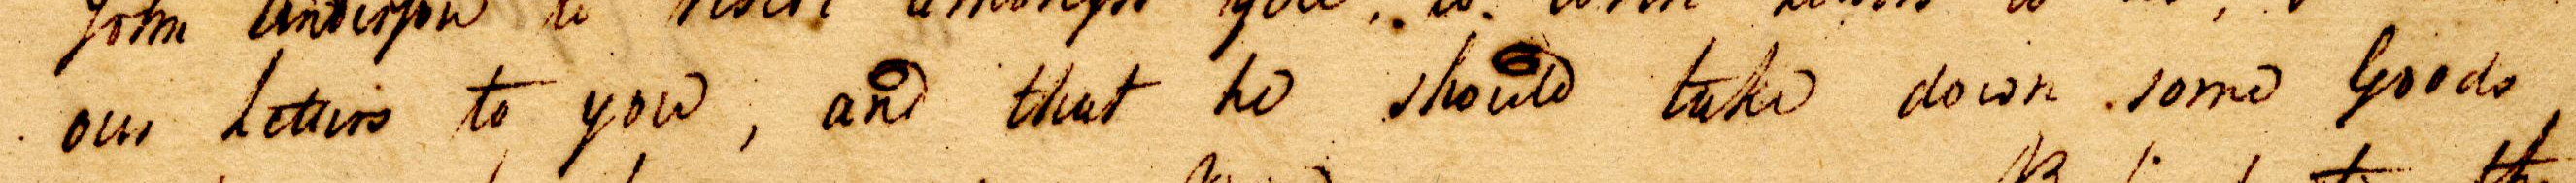our Letters to you, and that he should take down some Goods
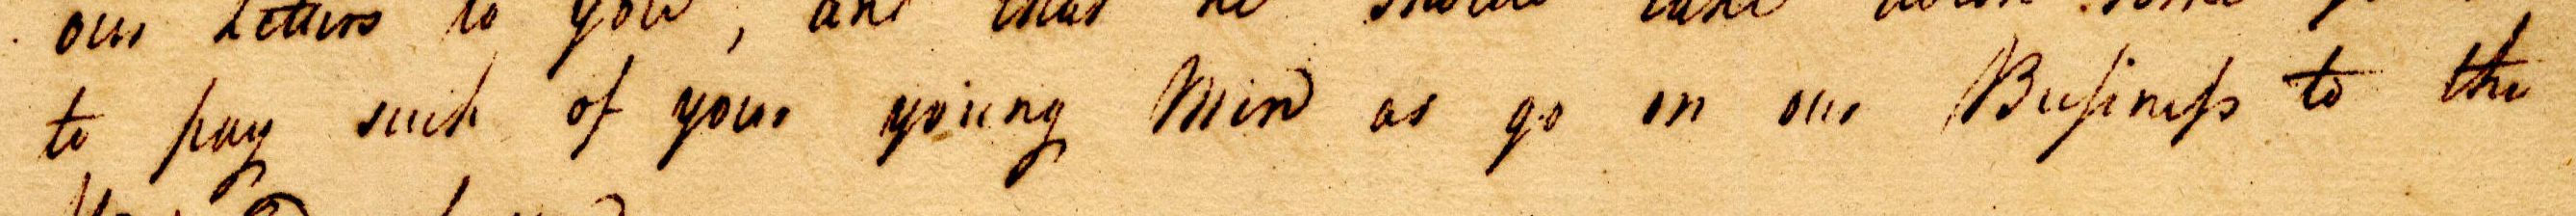to pay such of your young Men as go on our Business to the
